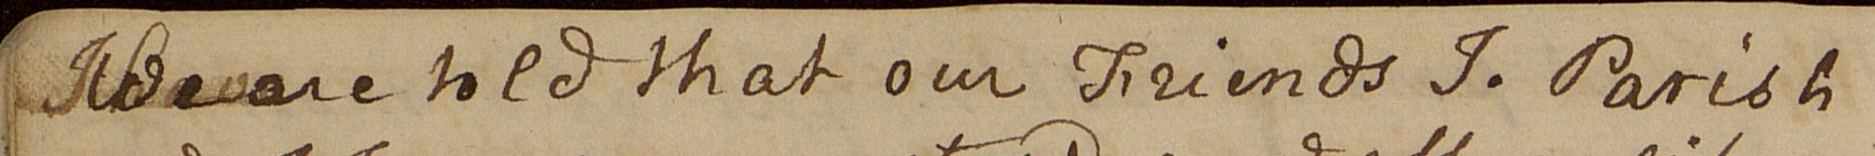We are told that our Friends I. Parish
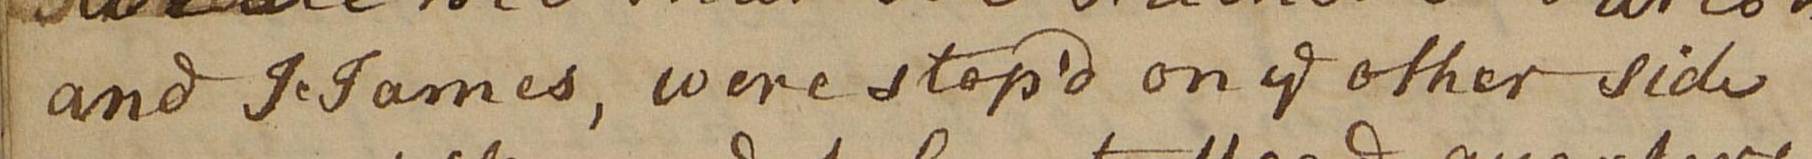and J. James, were stop'd on y^e other side
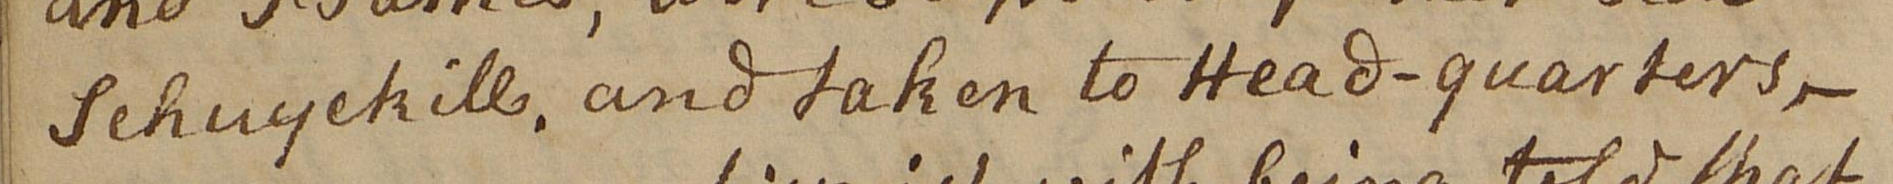Schuyckill, and taken to Head-quarters,-
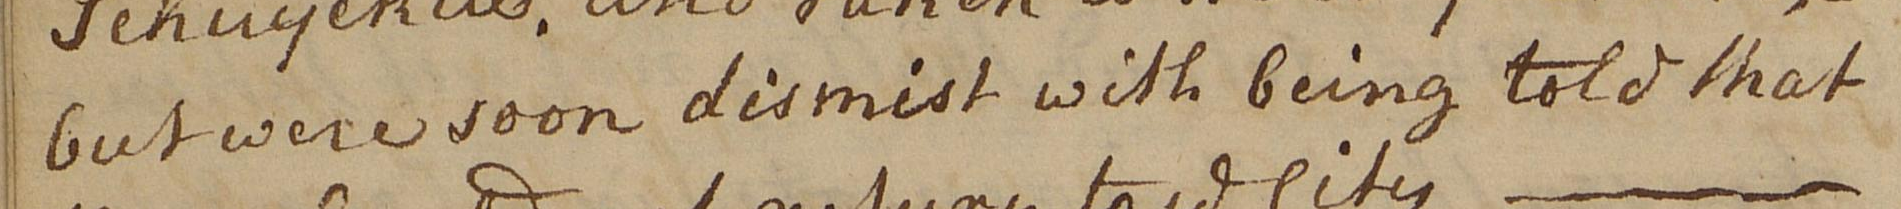but were soon dismist with being told that
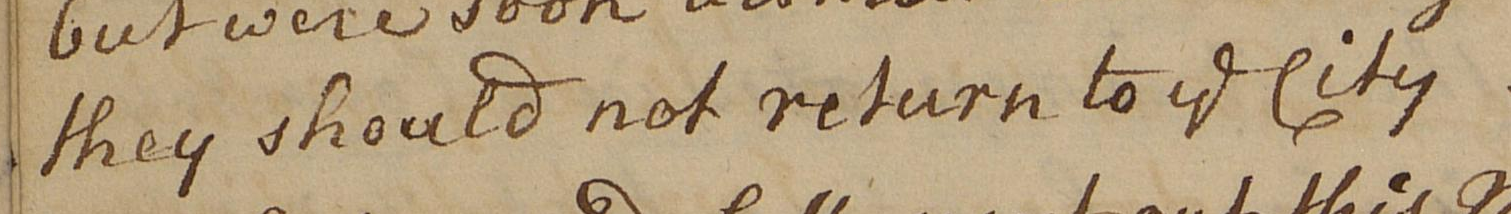they should not return to y^e City -
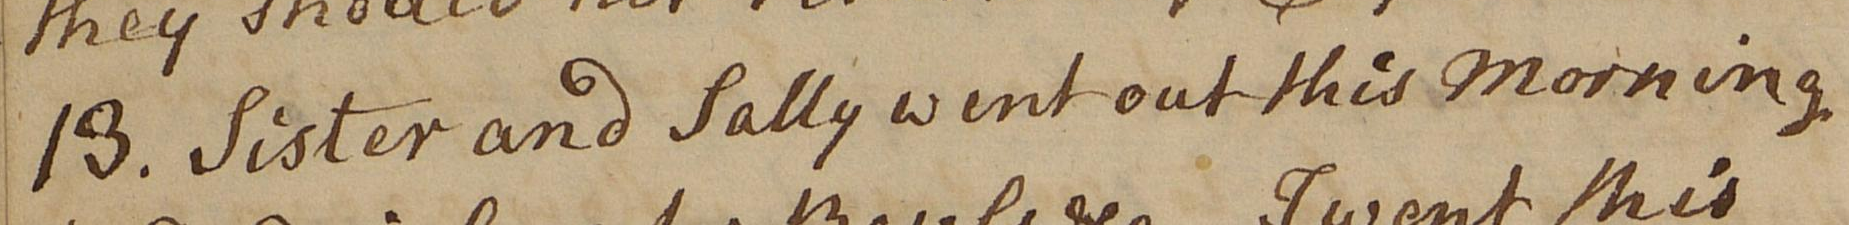13. Sister and Sally went out this morning
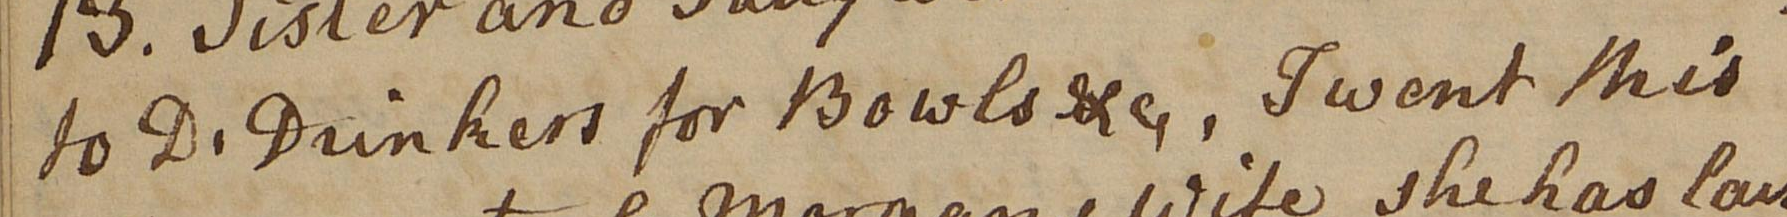to D. Drinkers for Bowls &c, I went this
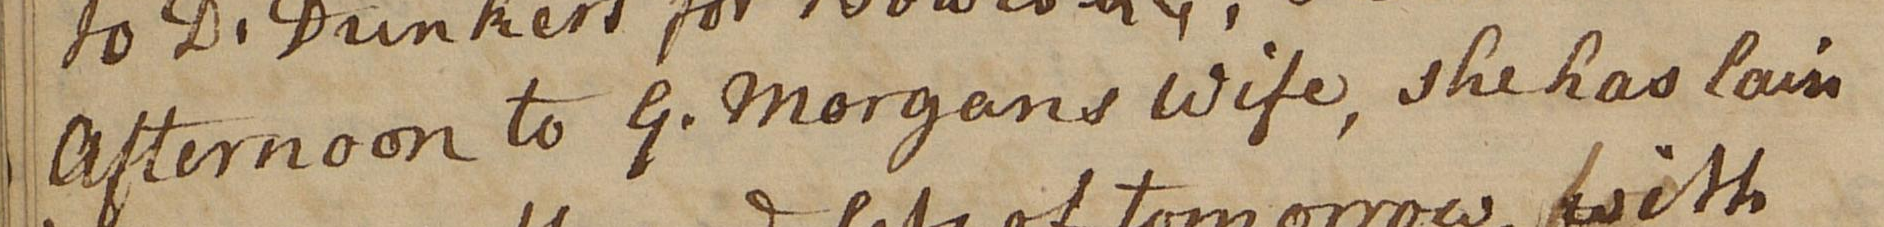Afternoon to G. Morgans Wife, she has lain
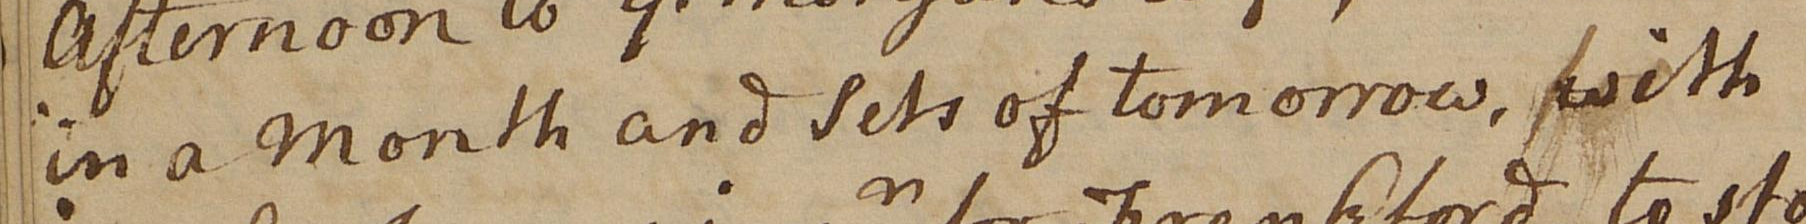in a Month and sets of tomorrow, with
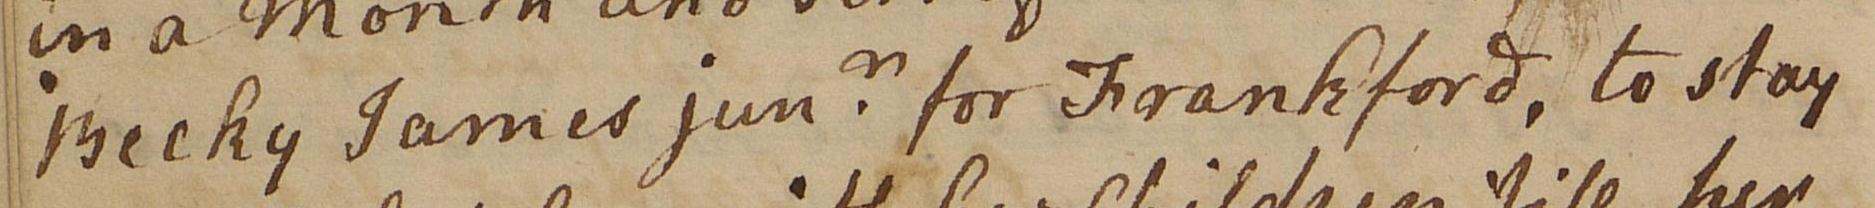Becky James jun^r. for Frankford, to stay
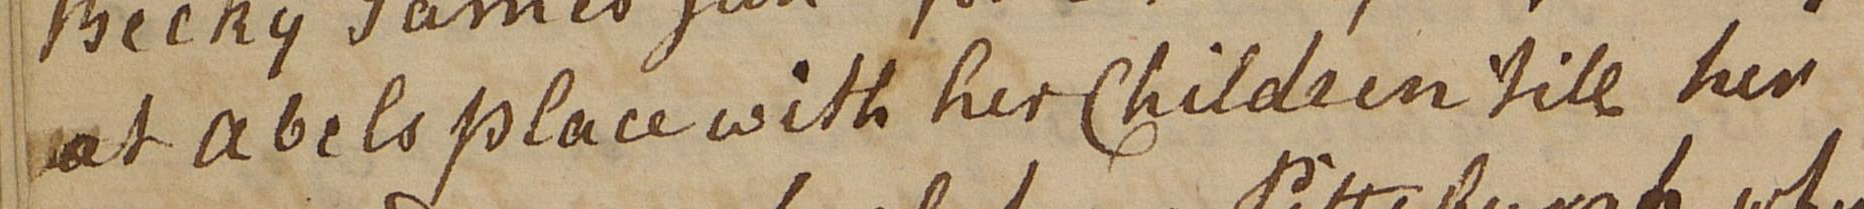at Abels place with her Children till her
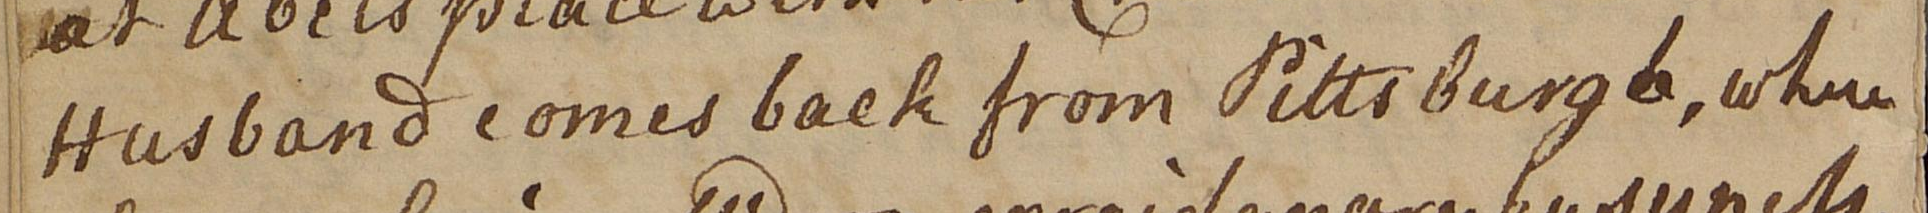Husband comes back from Pittsburgh, where
